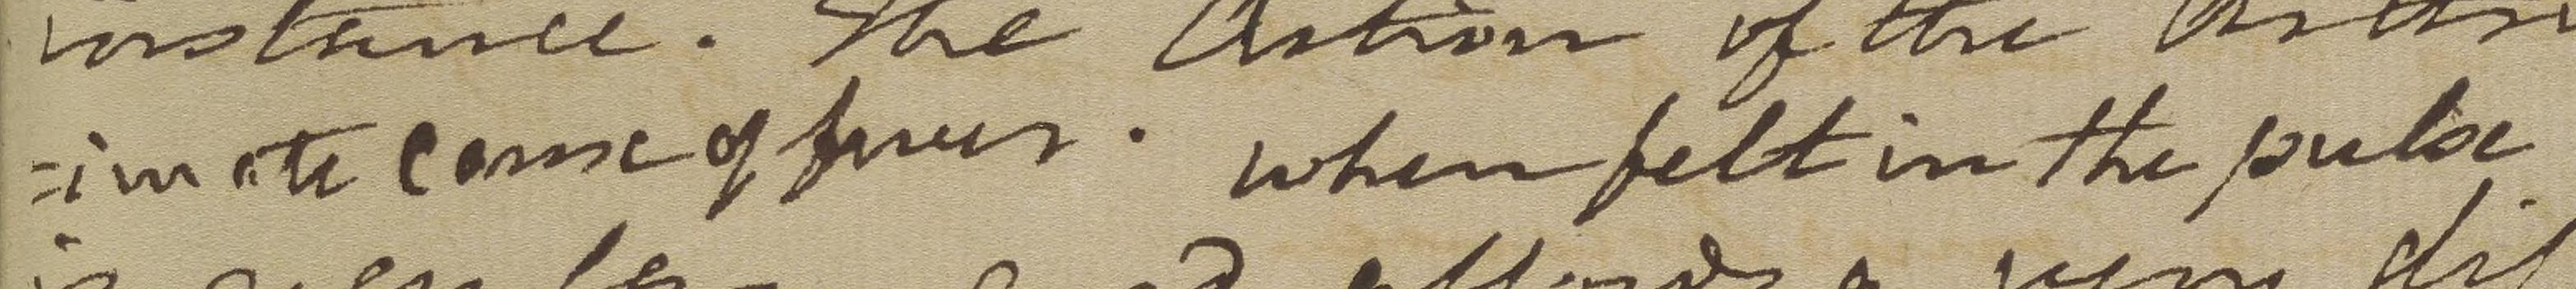-imate cause of fever. When felt in the pulse
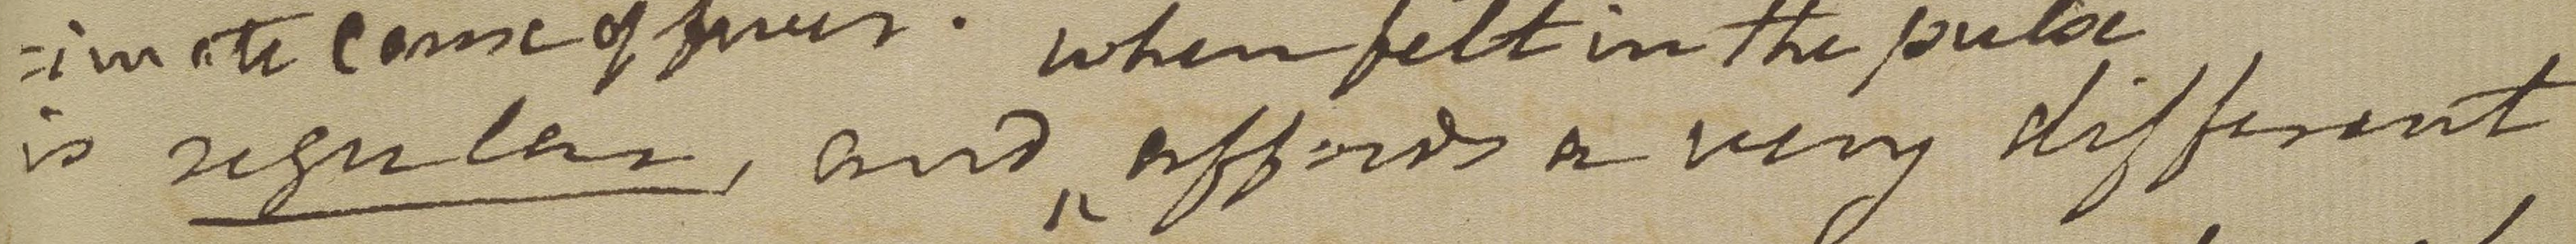is regular, and ^ affords a very different
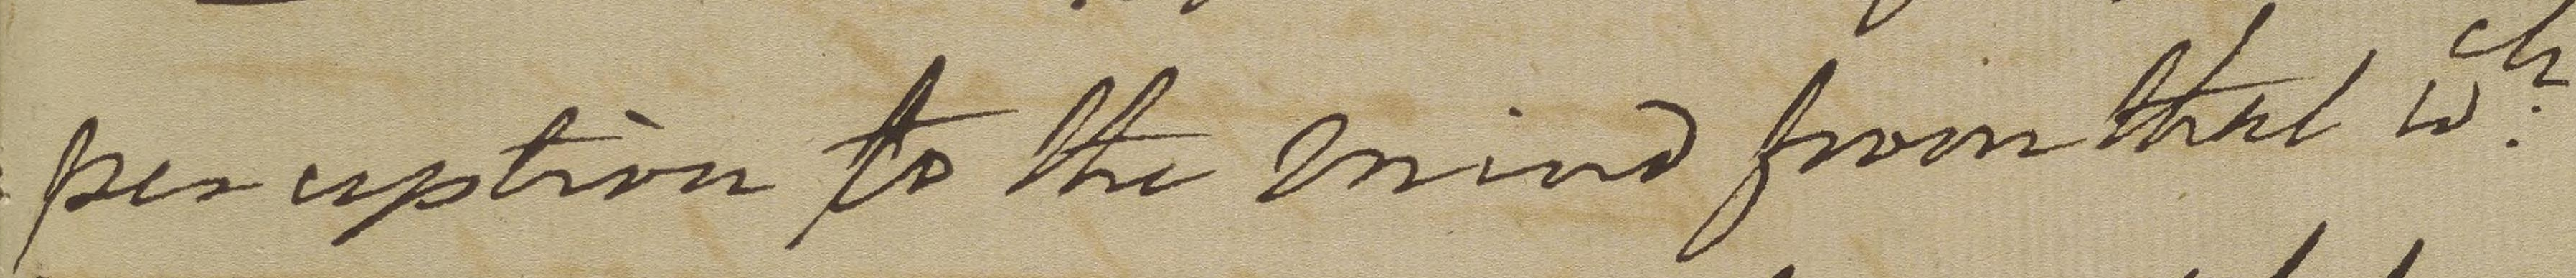perception to the mind from that w^ch:
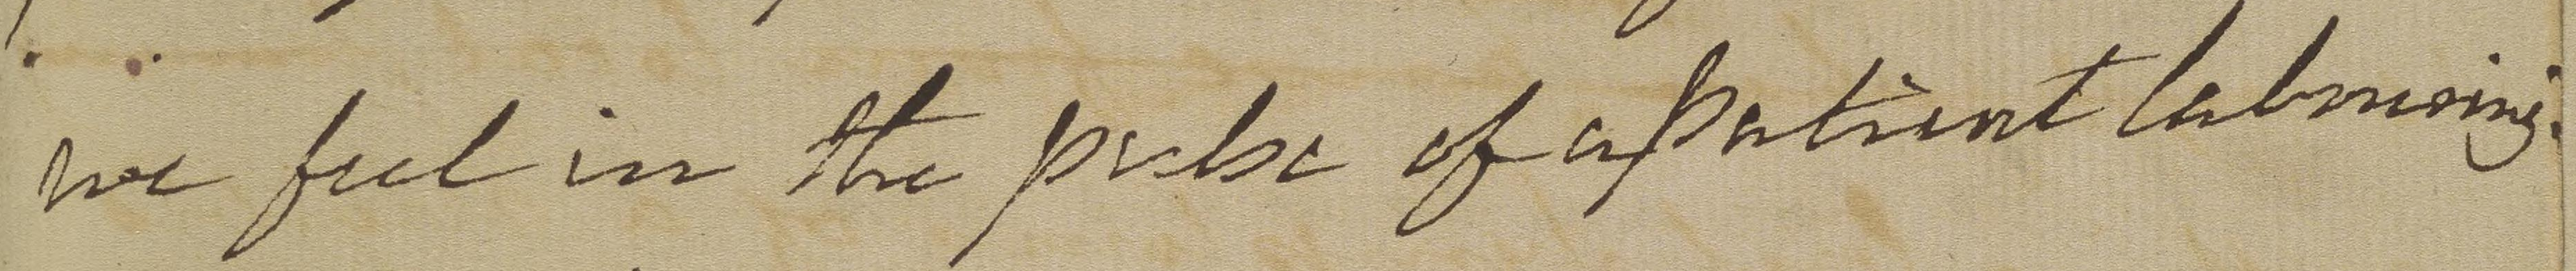are feel in the pulse of a patient labouring
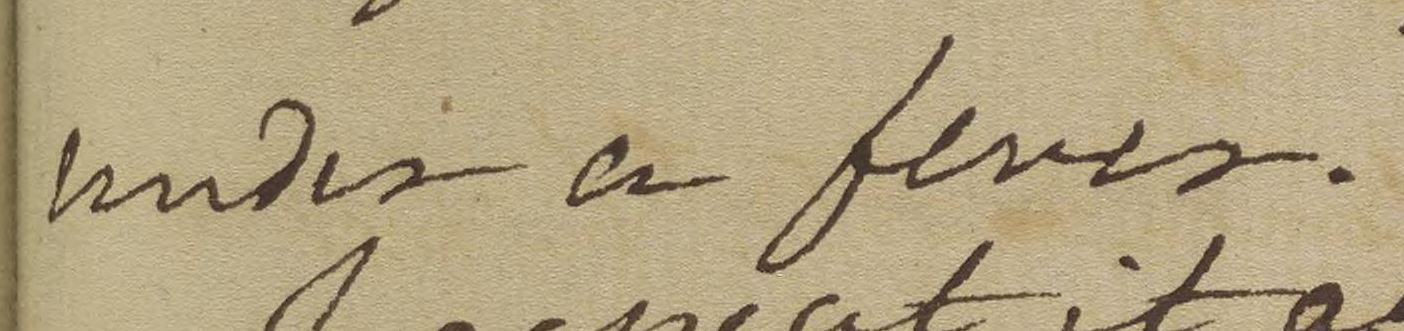under a fever.
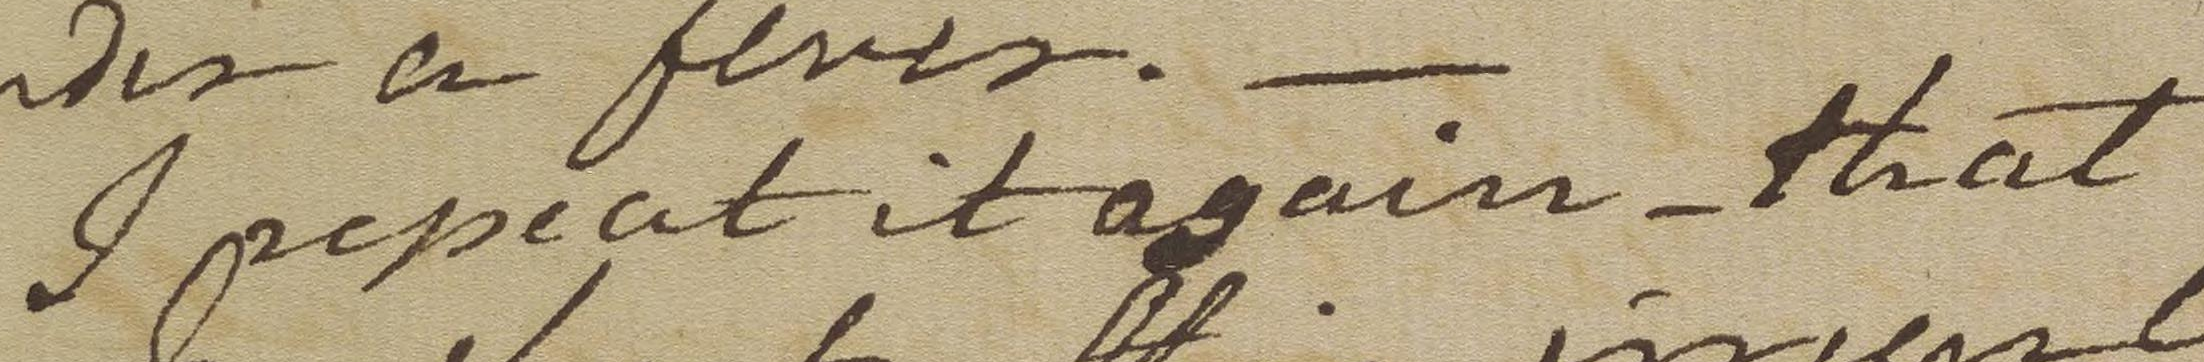I repeat it again that
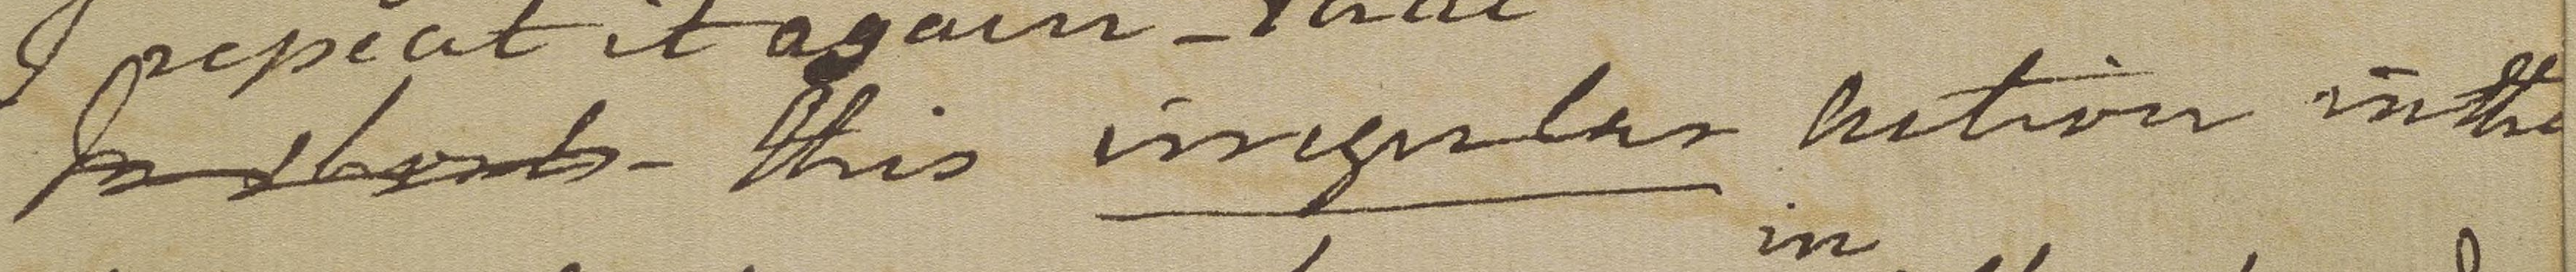In this irregular action in the
